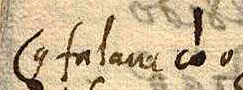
q̄ falaua cō o
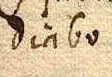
diabo
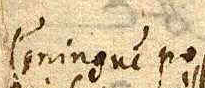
q̄ ninguē po
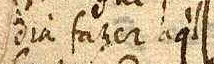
dia fazer a q̄l
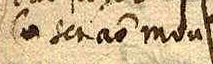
he senaõ mou
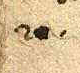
ro.
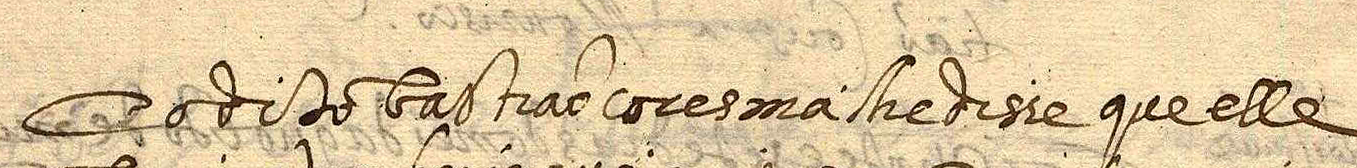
e o dito bastiaõ coresma lhe disse que elle
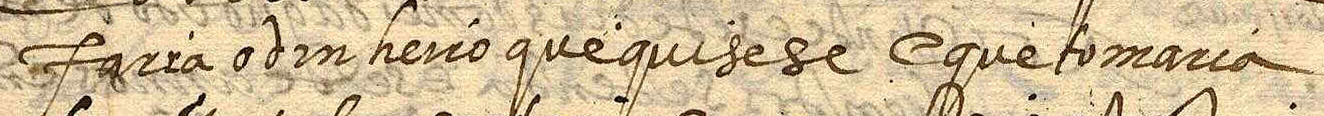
faria o dinheiro que quisese e que tomaria
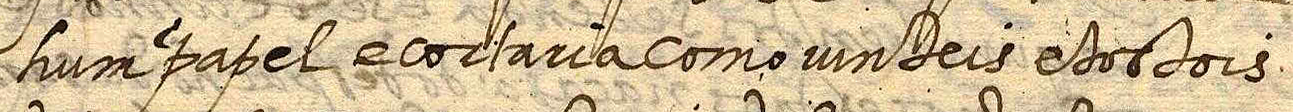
hum papel e cortaria como uinteis e tostois
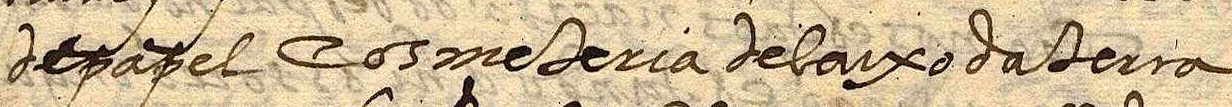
de papel e os meteria debaixo da terra
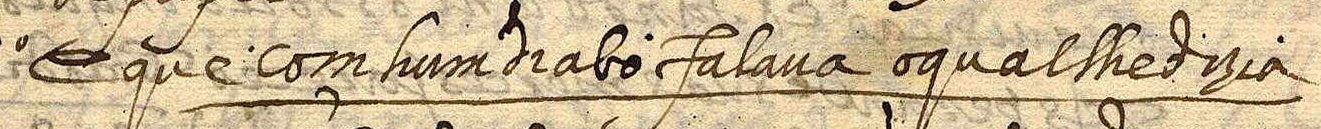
E que com hum diabo falaua o qual lhe dizia
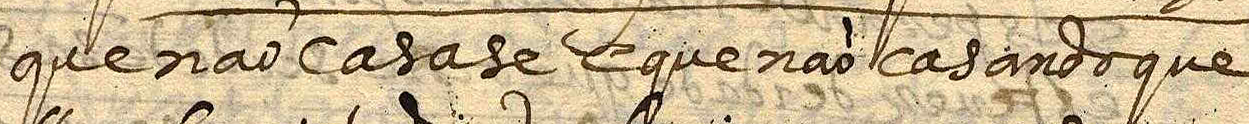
que naõ casase e que naõ casando que
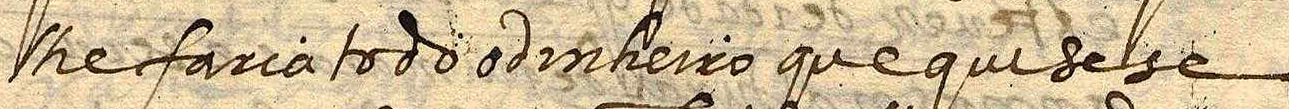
lhe faria todo o dinheiro que quisese
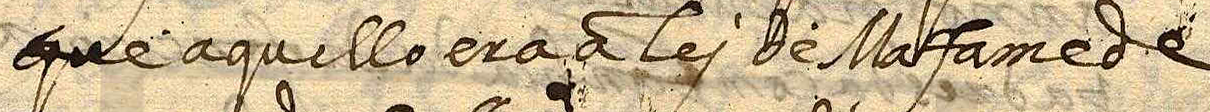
que aquillo era a lej de Mafamede
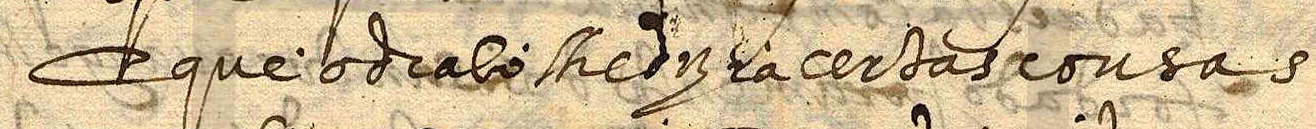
E que o diabo lhe dizia certas cousas
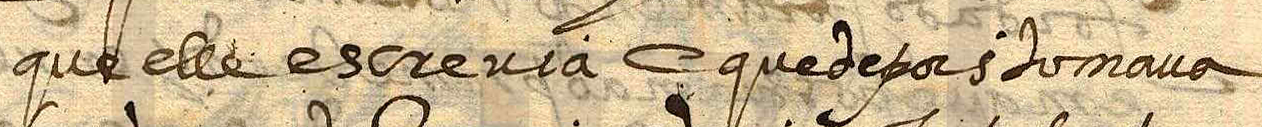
que elle escreuia e que depois tomaua
